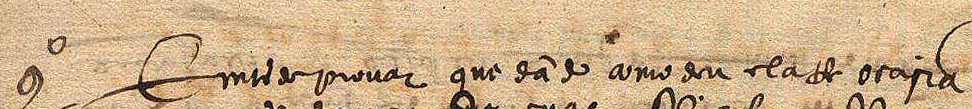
9o Emtēde prouar que dādo como deu ela Re ocasiā
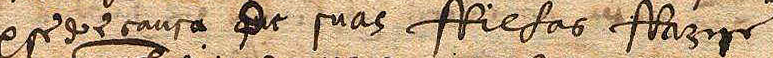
e sēdo ē causa de suas ffilhas ffazerē
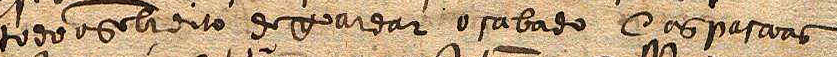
todo o s̄obrdito de goardar o sabado e as pascoas
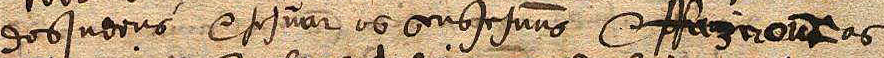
dos Judeus e jejūar os seus Jejūus e ffazer outras
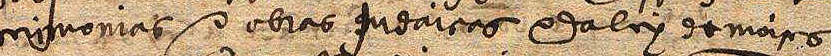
cerimonias e obras Judaicas e da ley de moises
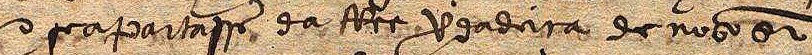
e se apartarrē da ffee ꝟdadeira de noso s̄or
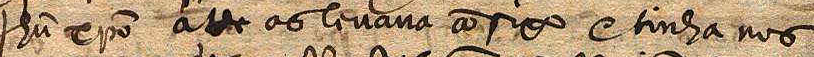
Jhū xpō a Re as leuaua c̄osigo e tinha nos
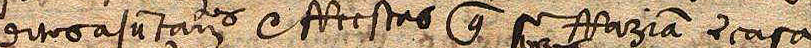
ditos aJūtamtos e ffeestas q̄ se ffaziā ē casa
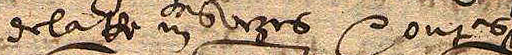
dela Re mtas vezes e outas
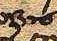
vezes
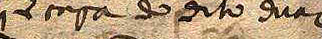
ē casa do dito duar
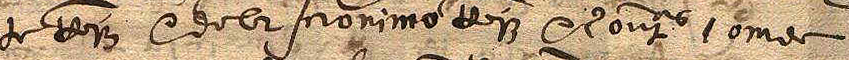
te R̄ojz e do b̄r Jeronimo R̄ojz e ē outras / omde
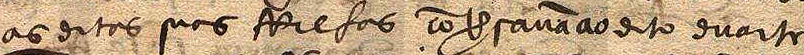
as ditas suas ffilhas c̄oꝟsauā ao dito duarte
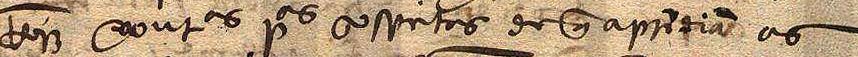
R̄ojz e a outas pas sospeitas de q̄ aprēdiā as
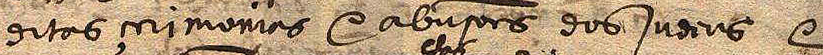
ditas cerimonias e abusões dos Judeus e
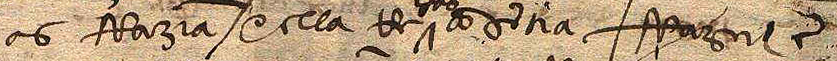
as ffaziā / e ella Re lhas c̄osētia ffazer / ē
